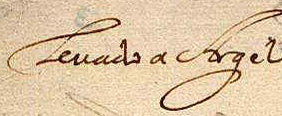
Leuado a Argel
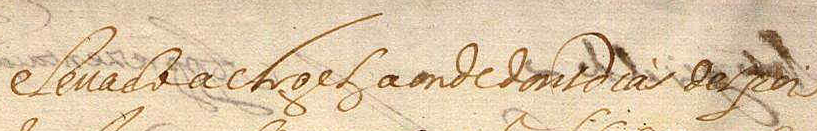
e leuado a Argel aonde dous dias despois
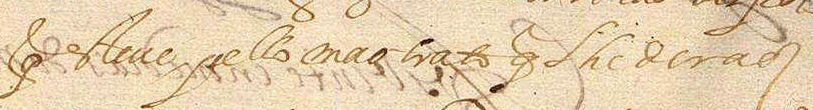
q̄ esteue, pello mao trato q̄ lhe deraõ
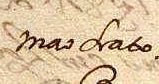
mao trato.
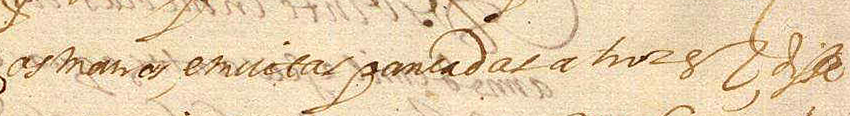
os mouros, e muitas pancadas atrozes, disse
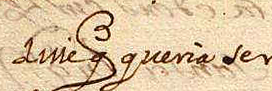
disse q̄ queria ser
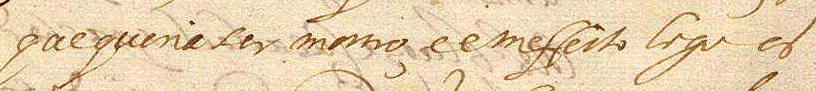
que queria ser mouro, e em effeito logo os
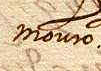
mouro
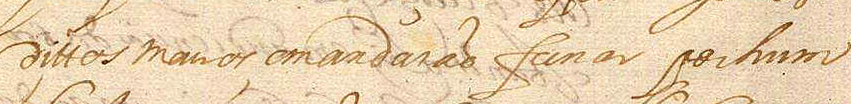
dittos mouros o mandaraõ fanar por hum
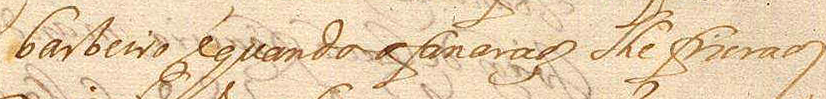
barbeiro e quando o fanaraõ lhe fizeraõ
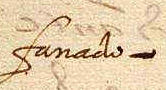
fanado -
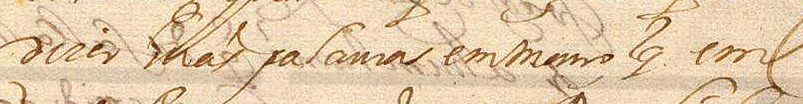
dizer huās palauras em mouro, q̄ em
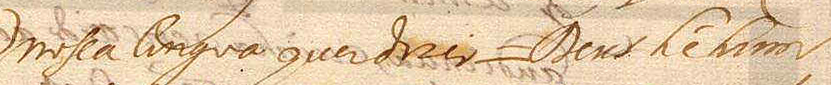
nossa lingoa quer dizer = Deus hé hum
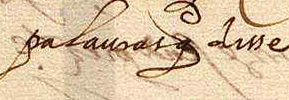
palauras q̄ disse
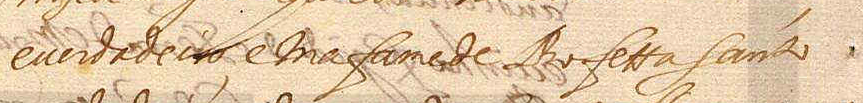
e uerdadeiro e mafamede Profetta santo
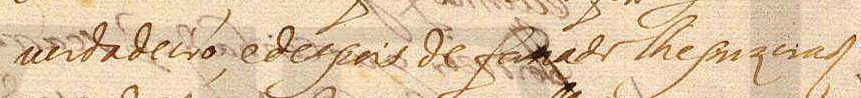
uerdadeiro, e despois de fanado lhe puzeraõ
